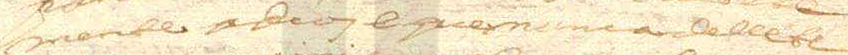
mente a Deos e que nunca delle te
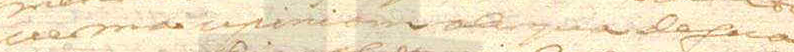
ue ma opiniam acerqua de sua
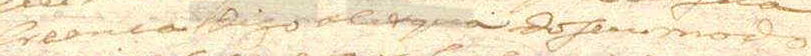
Creanca digo acerqua do seu modo
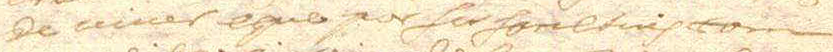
de uiuer e que por ser sanchristam
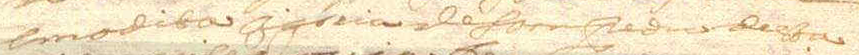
em a dita Jgreia de sam Pedro desta
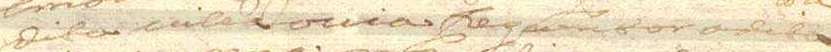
dita uilla o uia frequentar a dita
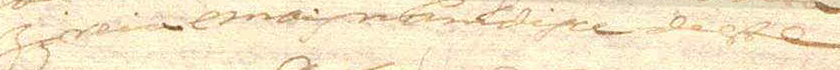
Jgreia e mais nam disse deste
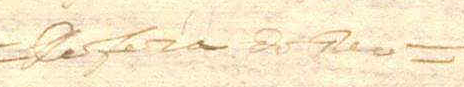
= Defeza do Reo =
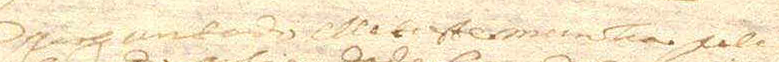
perguntado elle testemunha pello
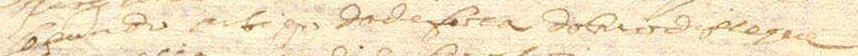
segundo artigo da defeza do Reo disse que
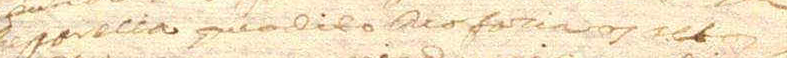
lhe parecia que o dito Reo fazia os actos
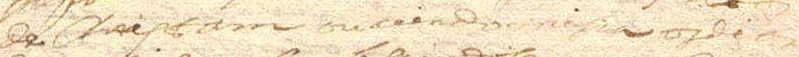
de Christam ouuindo missa os dias
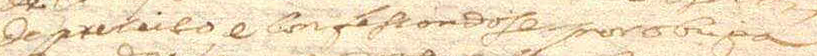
de preceito e confessandose por obriga
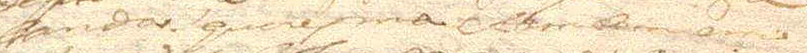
san da quaresma e tambem em
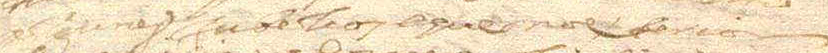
algunos Jubeleos e que no exterior
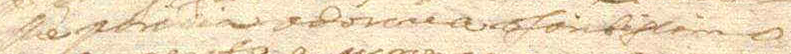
lhe parecia adoraua o santissimo
